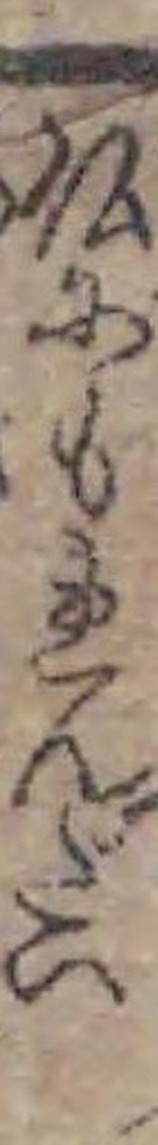仏にもれんだい
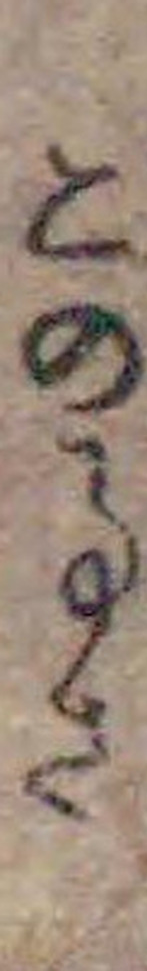この事さ
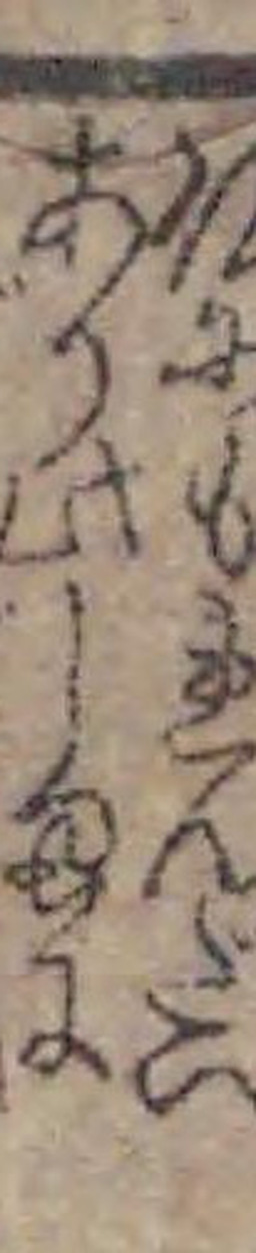あり此しまに
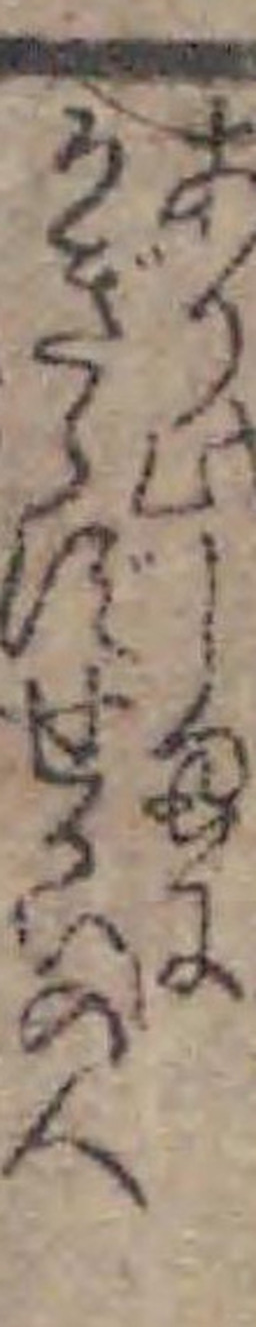かぎらずせかいの人
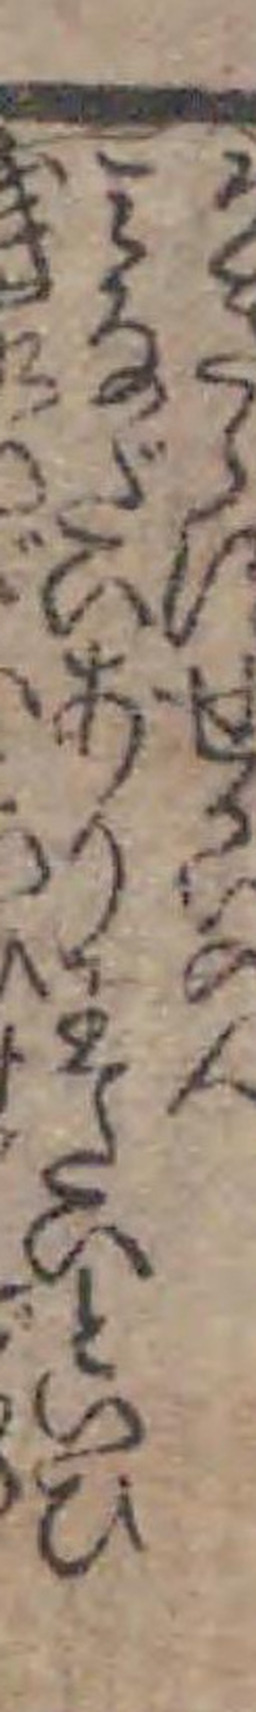みなだいあり王たいといひ
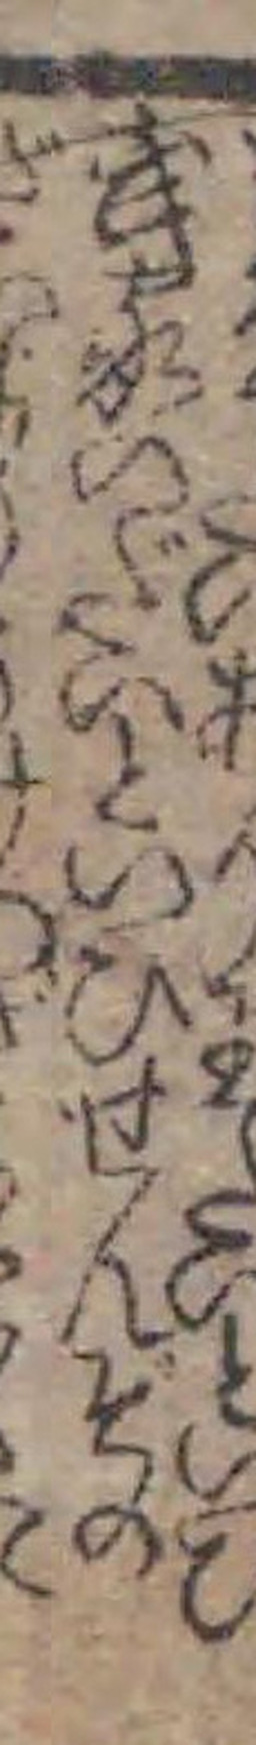武家のいだいといひせんぞの
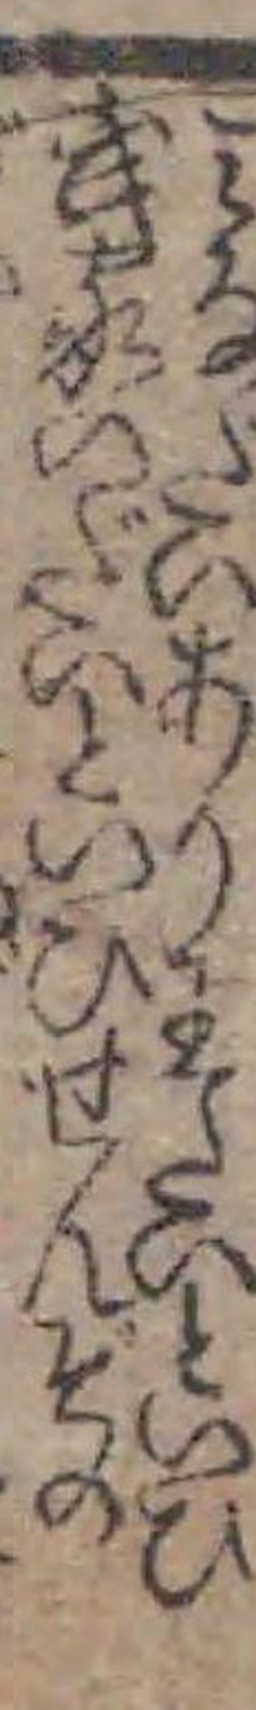武家のいだいといひせんぞの
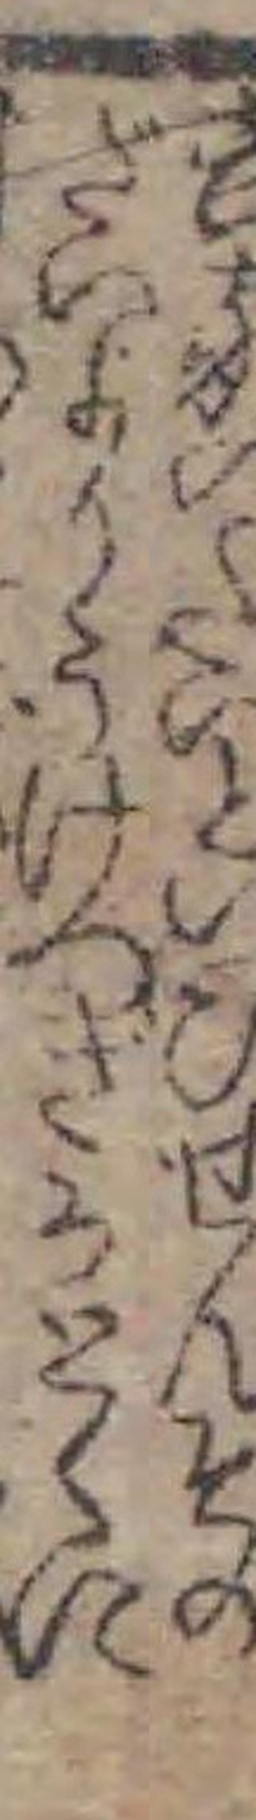だいよりうけつぎかとくに
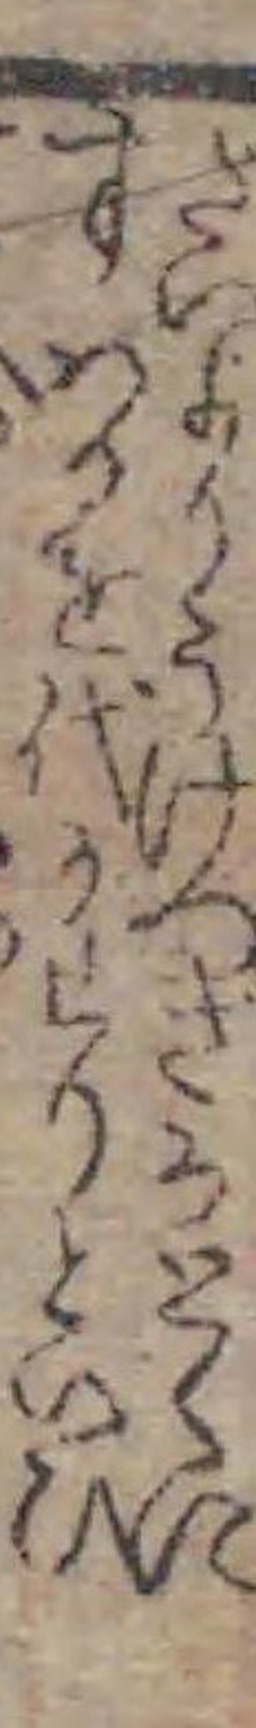すはるを代かわりといひ
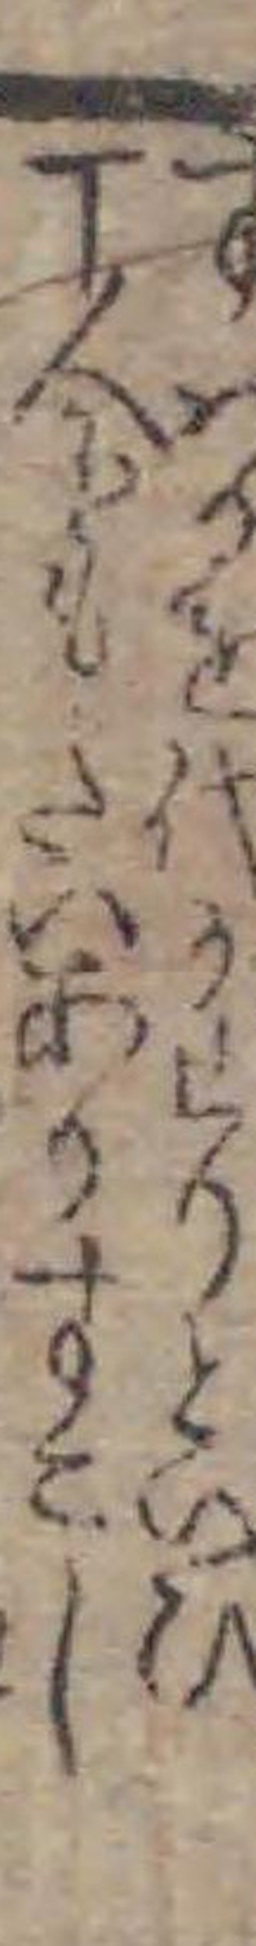丁人にもたいありすこし
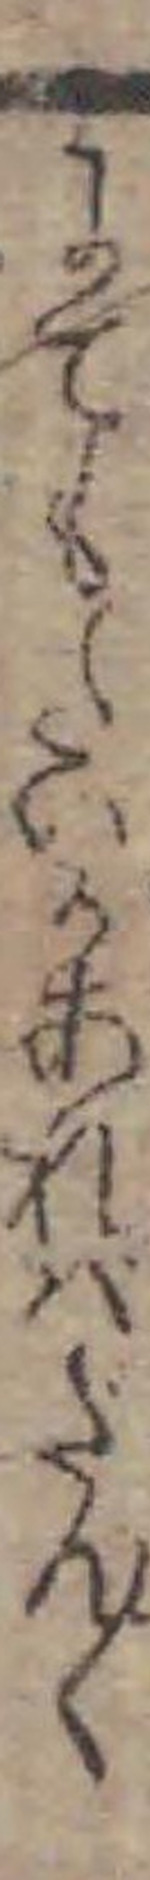にてもたいかあればだん〳〵
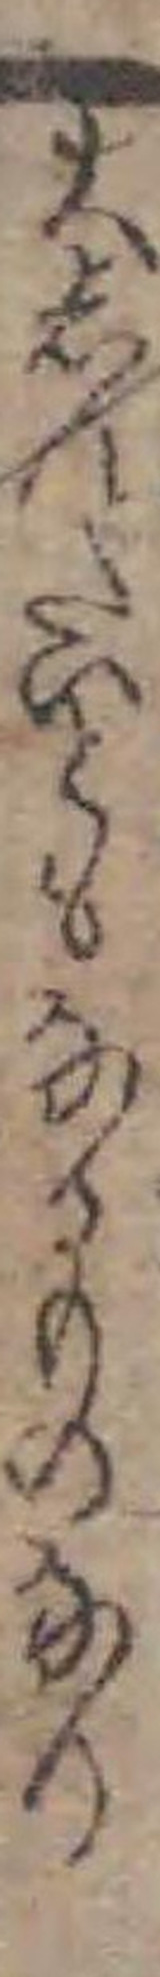大しんだいともなるものなり
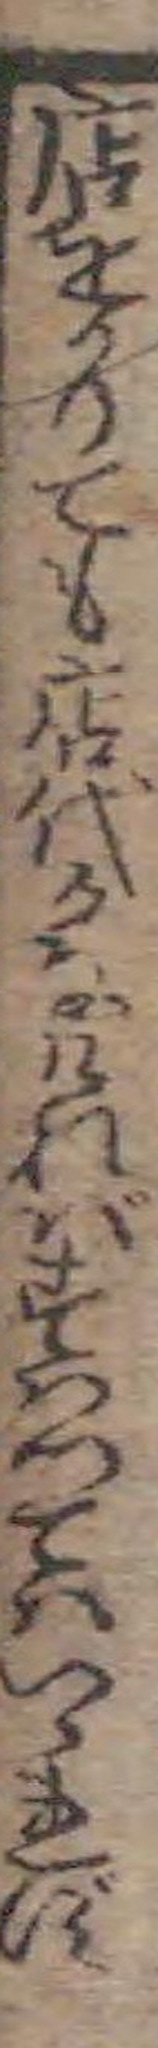店をかりても店代かなければすはつてはいられず
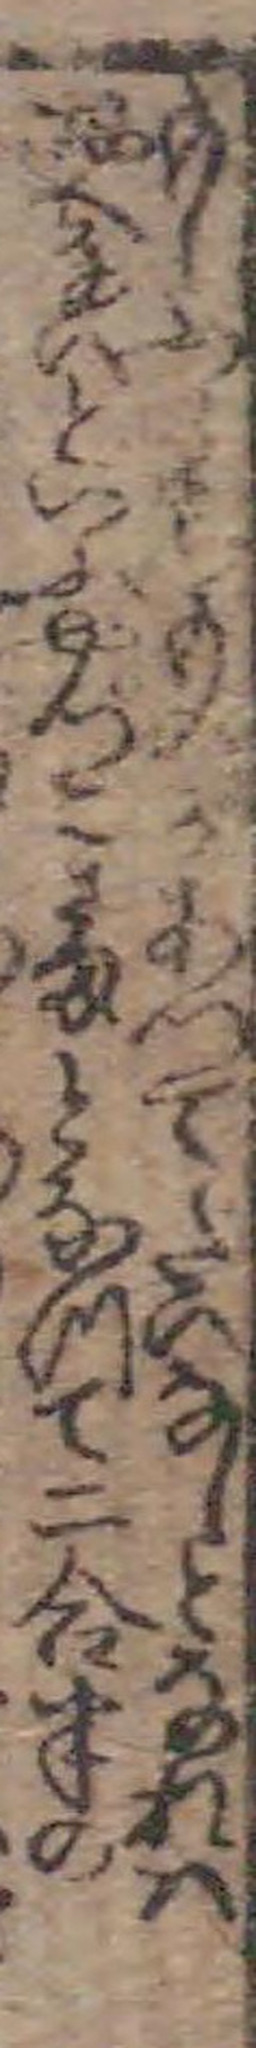おへないといふやつこさまとなつて二合半の
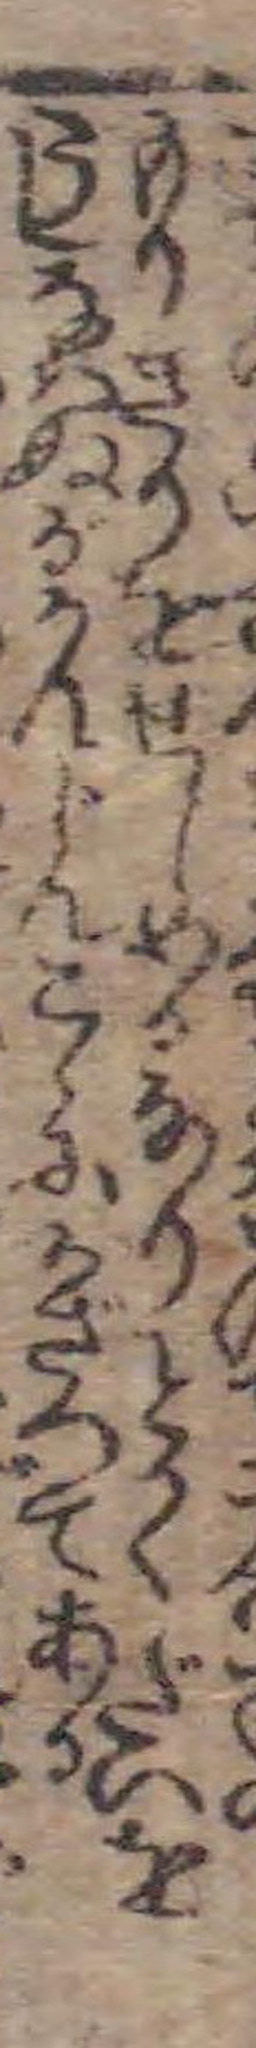うしなはぬがかんじんこゝにかざつてある
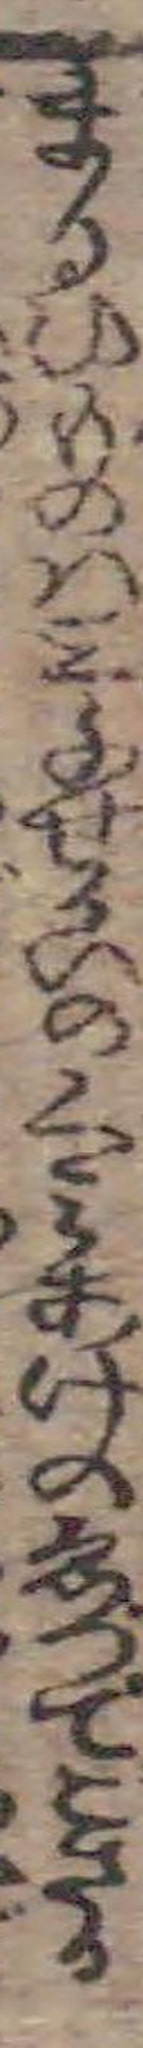まるひものは三千せかいのくみあげのゑづでこさる
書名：奇妙頂礼胎錫杖 : 3巻
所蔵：国立国会図書館 National Diet Library, JAPAN
